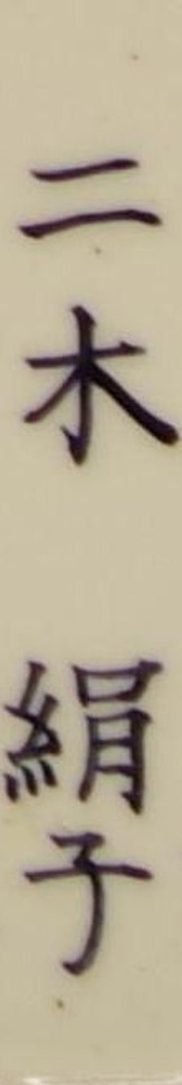二木絹子
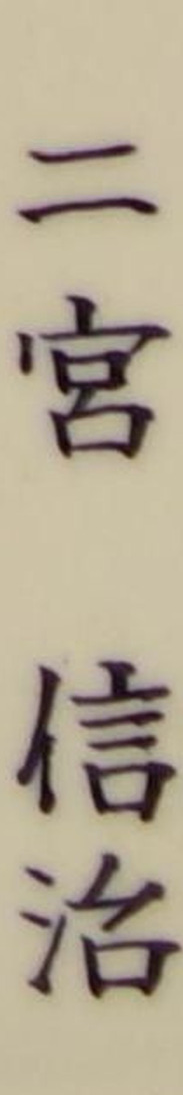二宮信治
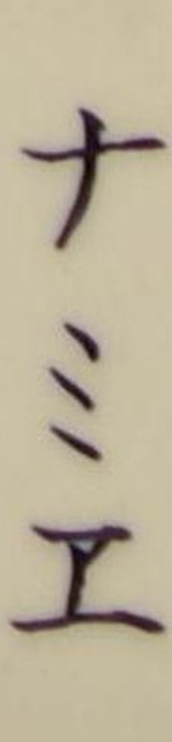ナミエ
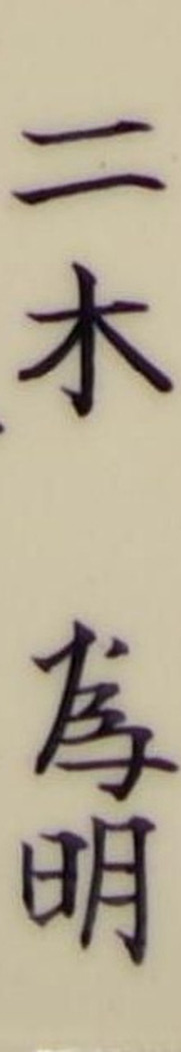二木為明
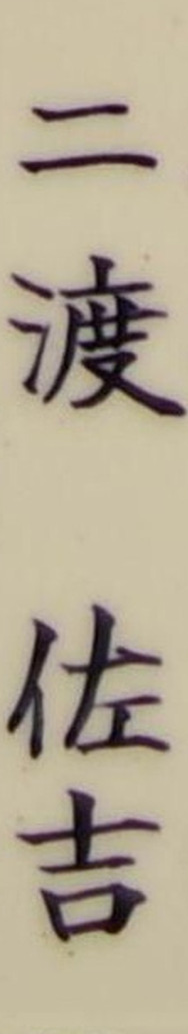二渡佐吉
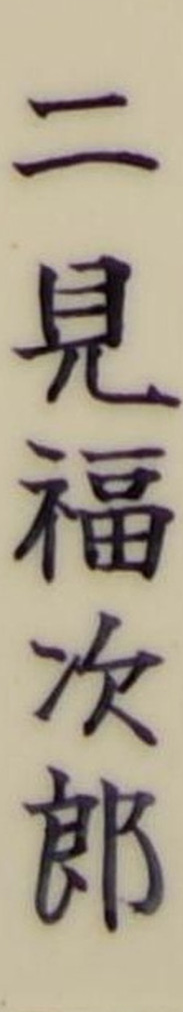二見福次郎
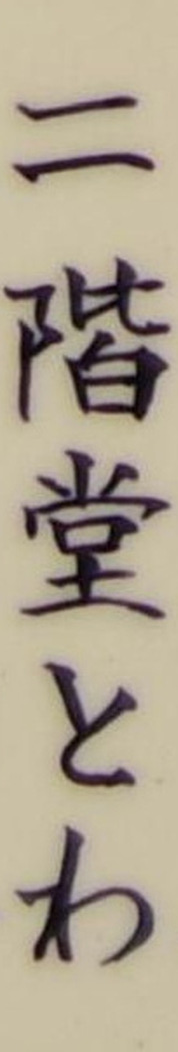二階堂とわ
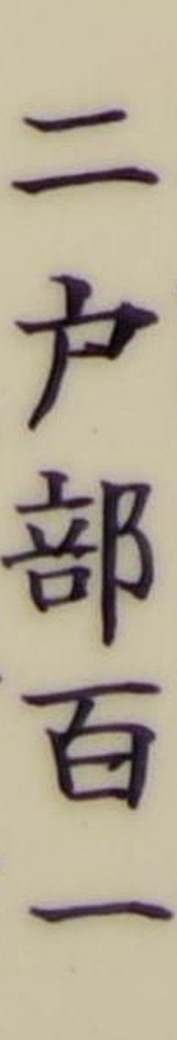二戸部百一
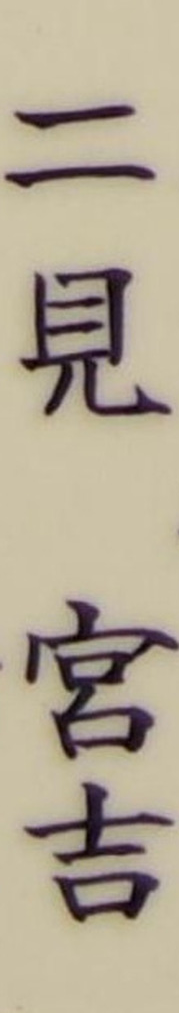二見宮吉
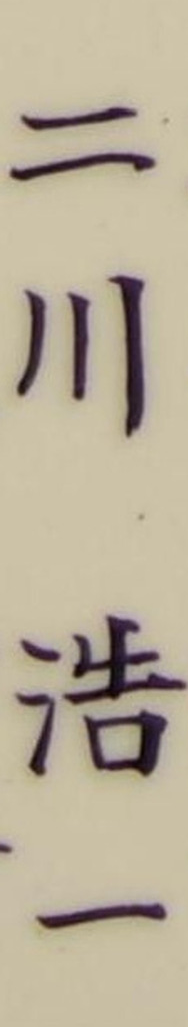二川浩一
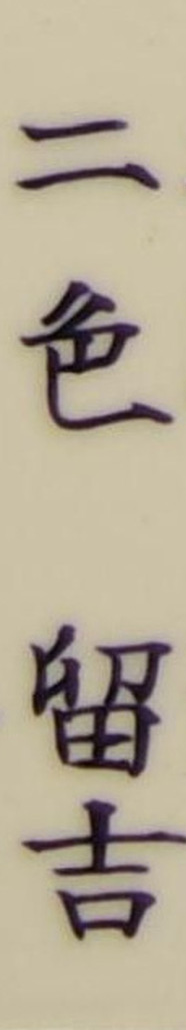二色留吉

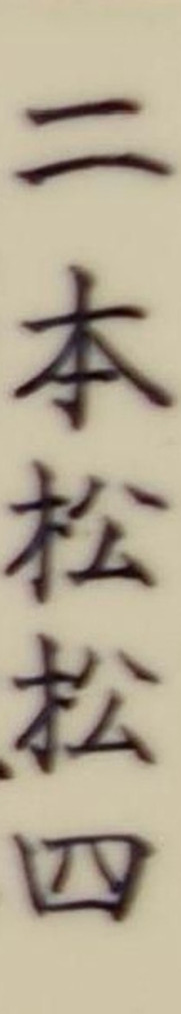二本松松四
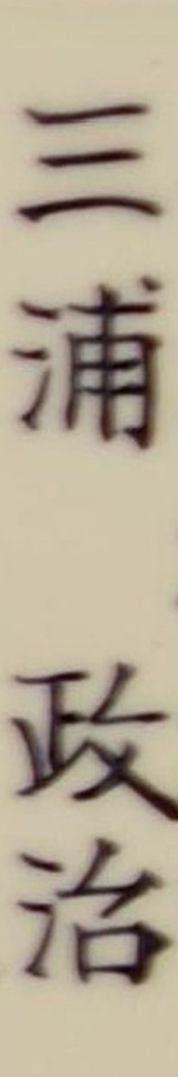三浦政治
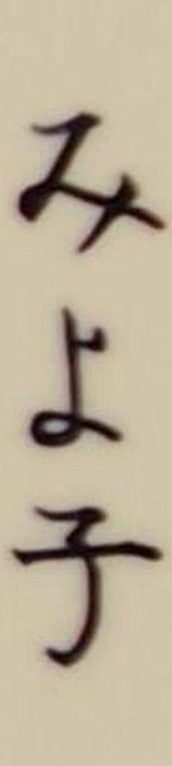みよ子
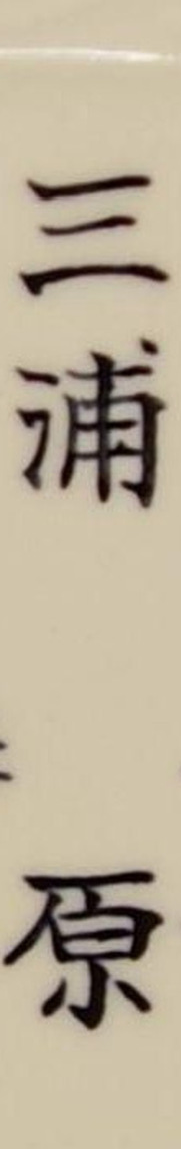三浦原
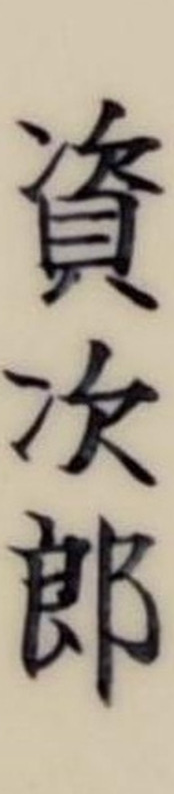資次郎
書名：E~L
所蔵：高野山金剛峯寺
